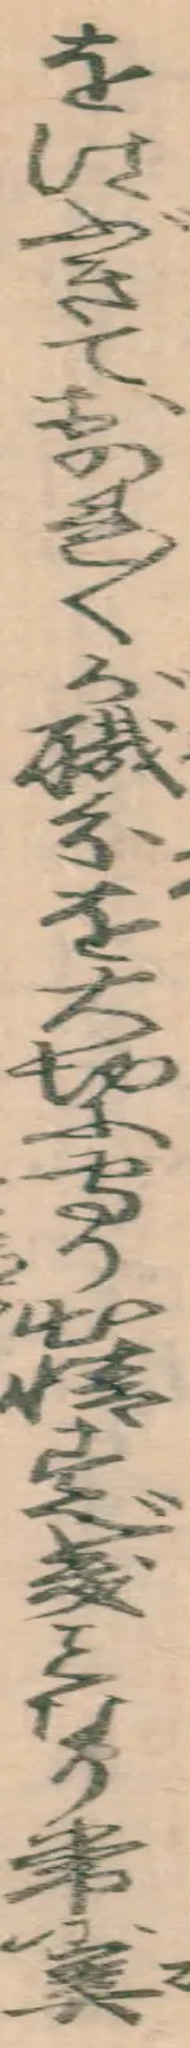をはぶきておのれ〳〵が職分を大切に守り出精すべきことなり常に美
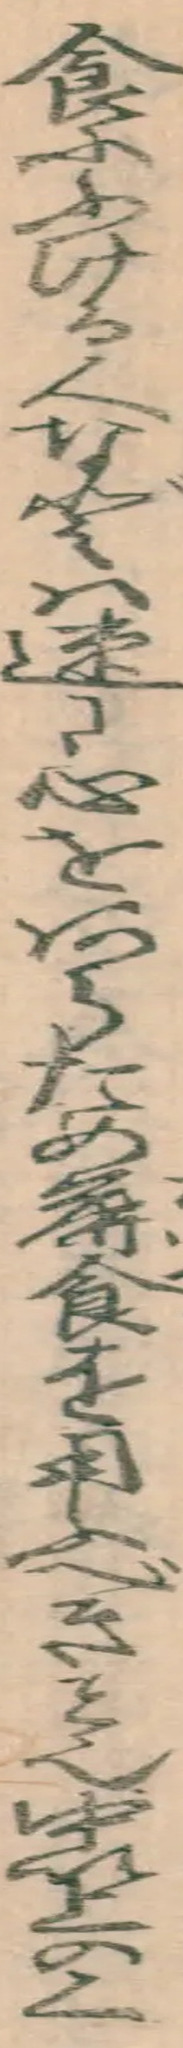食にふける人などは速に心をあらため麁食を用ふべきこと也中以上のく
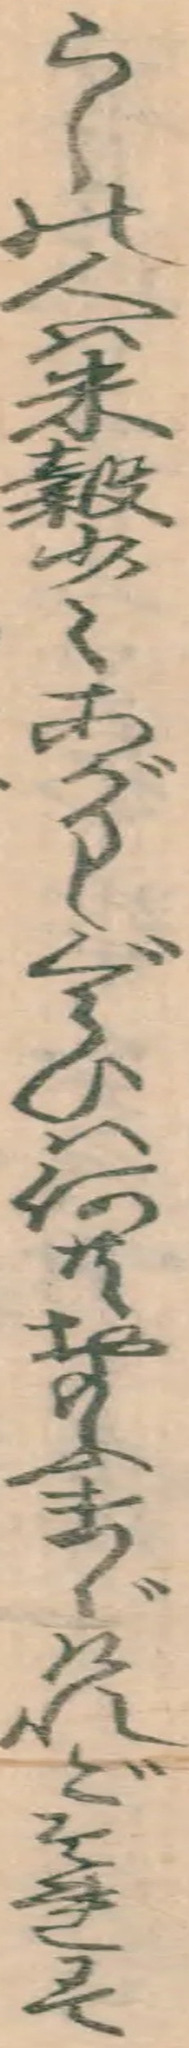らしの人は米穀少々あがりしぐらひは何共おもふまじけれどそれにて
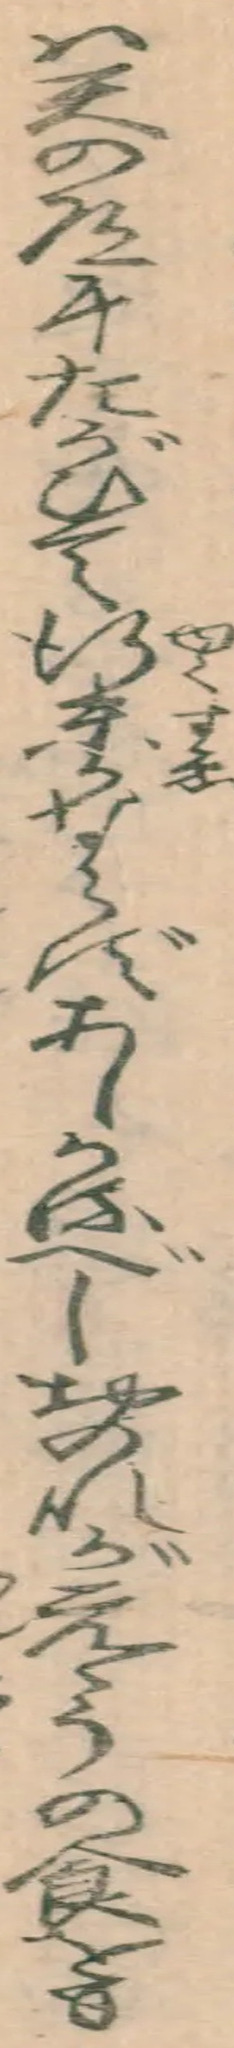は天の道にたがひて行末ならずあしかるべしおのれがえゝうの食をも
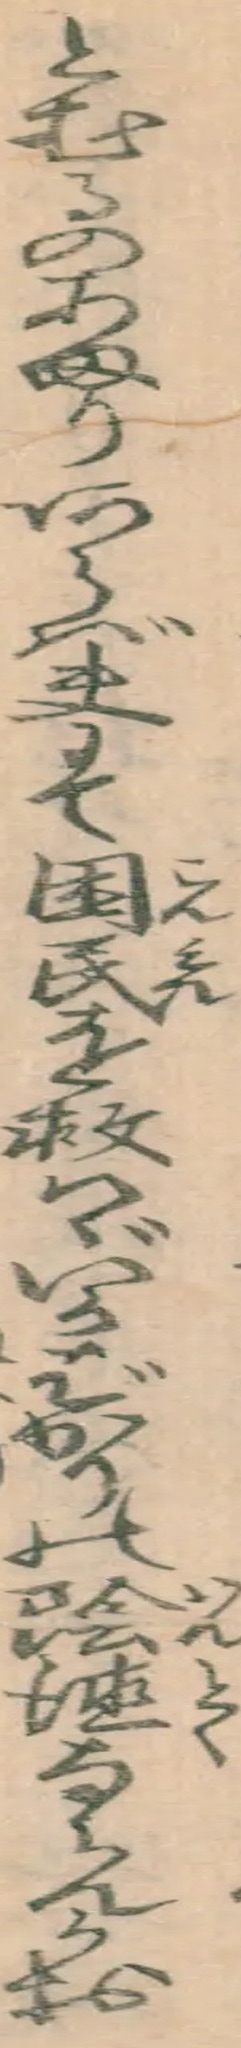とむるのあまりあらば夫にて困民を救はゞいかばかりの陰徳ならんかお
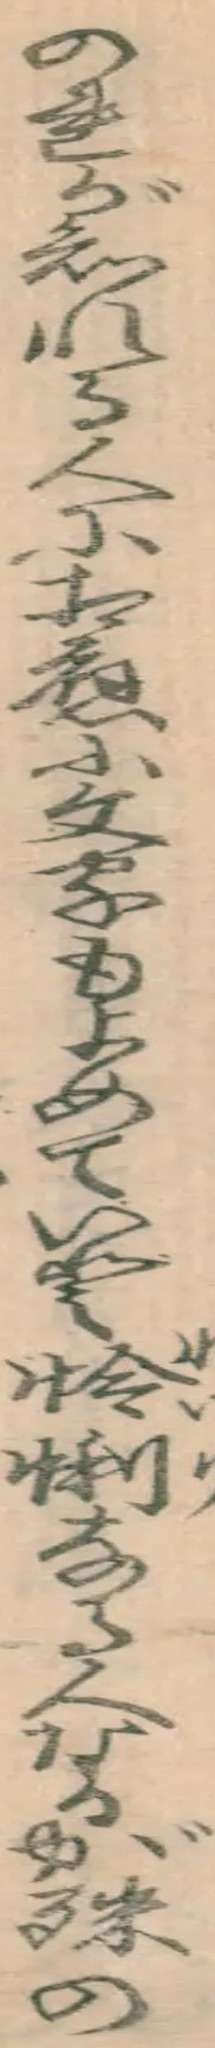のれが知れる人に相応に文字もよめていと怜悧なる人なるが殊の
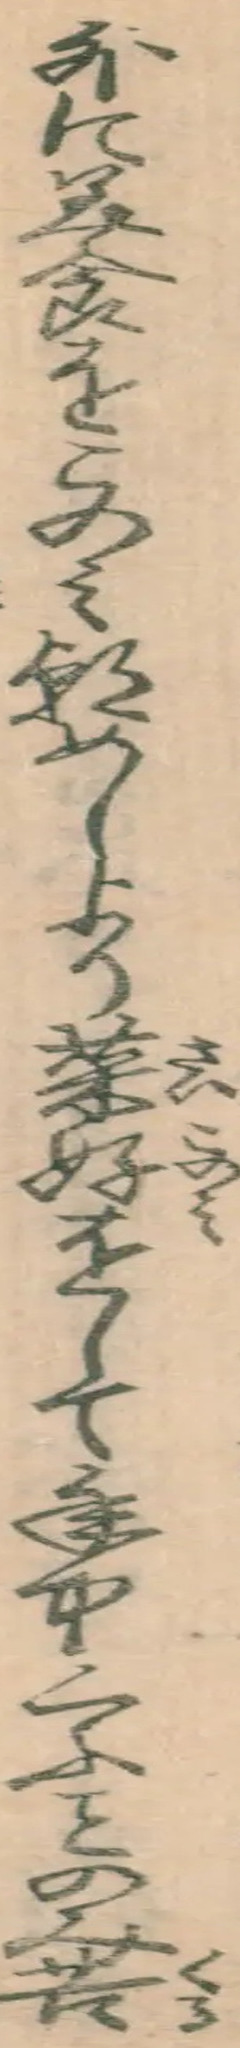外に美食をこのみ朝めしより菜好をして年中くふことのみ苦
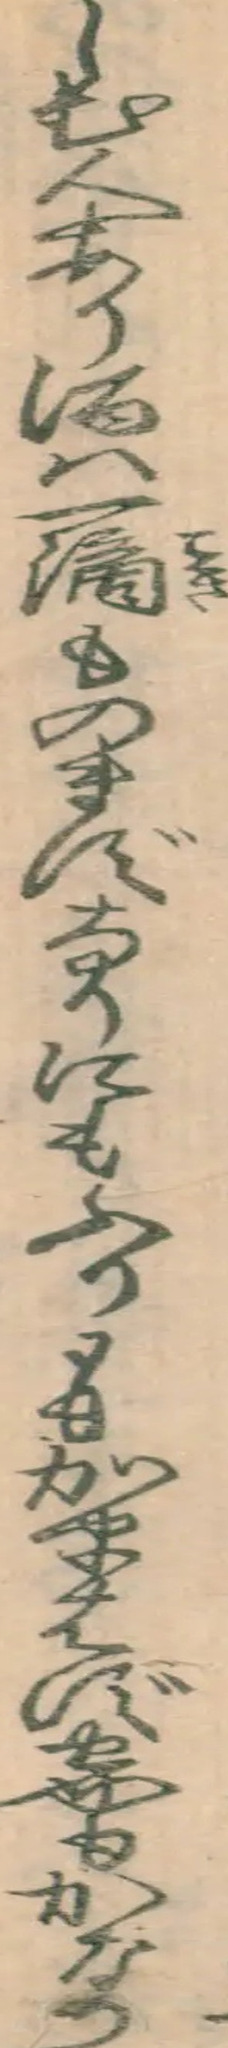しむ人あり酒は一滴ものまずなりにもふりにもかまはず家もかなり

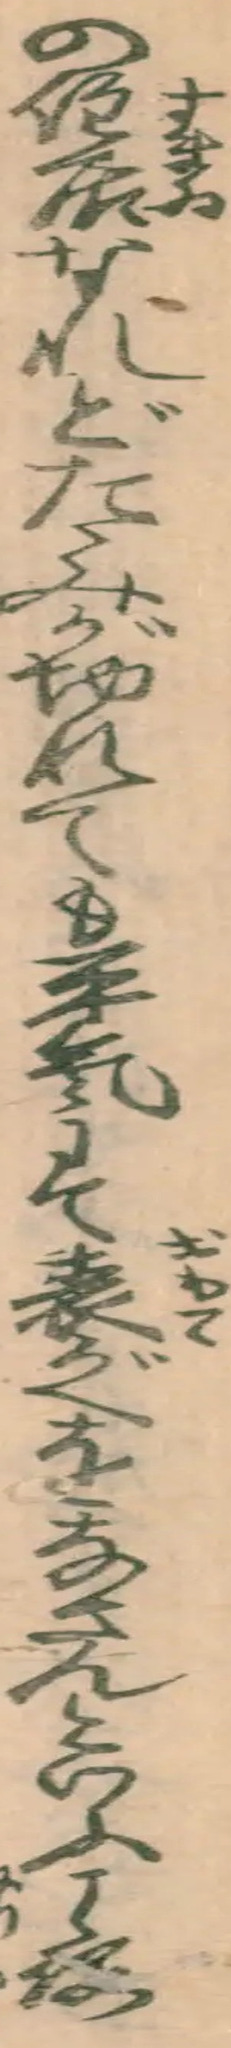の住居なれどたゝみが切れても平気にて表がへをなさんといふこゝろ
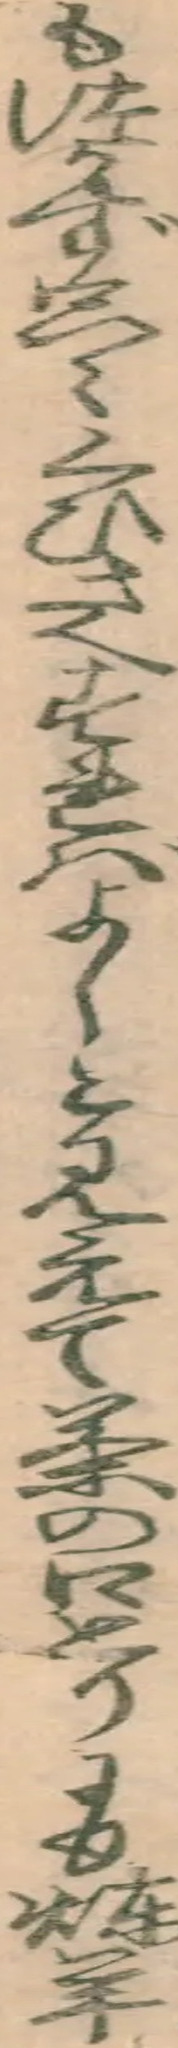もつかず只々くひさへすればよしと見えて茶の口とりにも煉羊
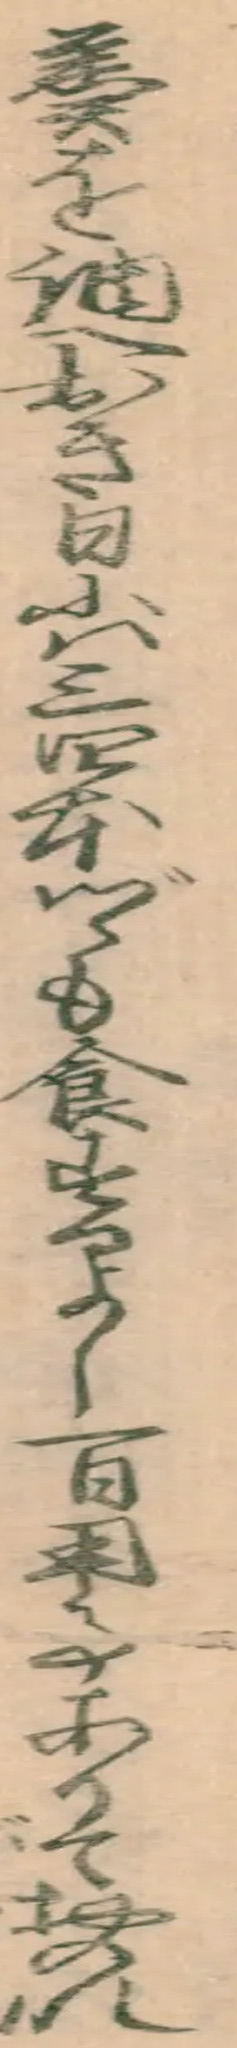羮を調へおき日には三四本づゝも食するよし一日用事ありておのれ
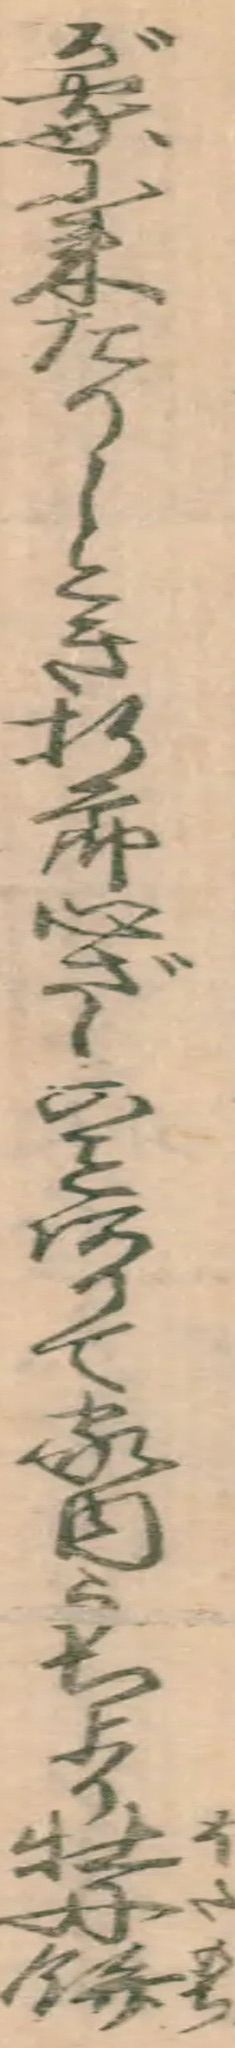が家に来たりしとき折節心ざしのことありて家内うちより牡丹餅
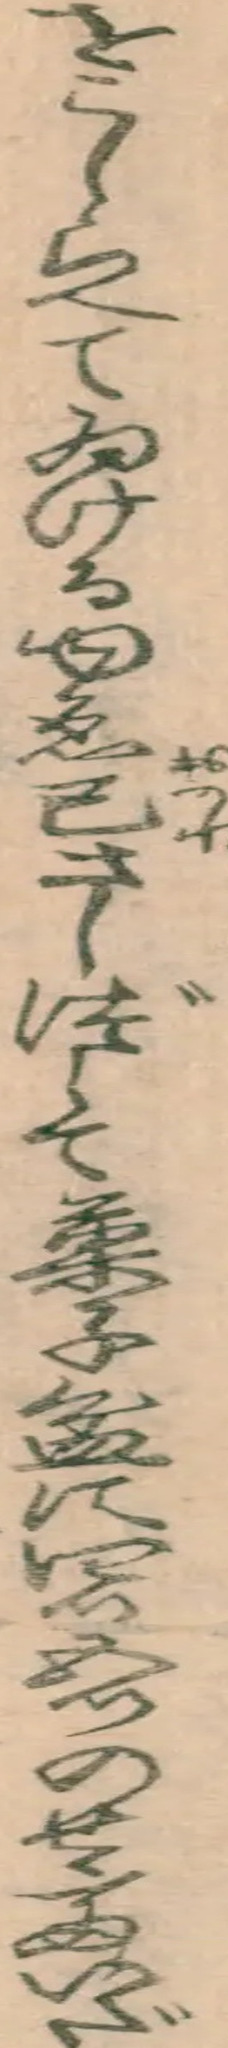をこしらへてゐけるゆゑ己さしづして菓子盆に四ッ五ッのせていだ
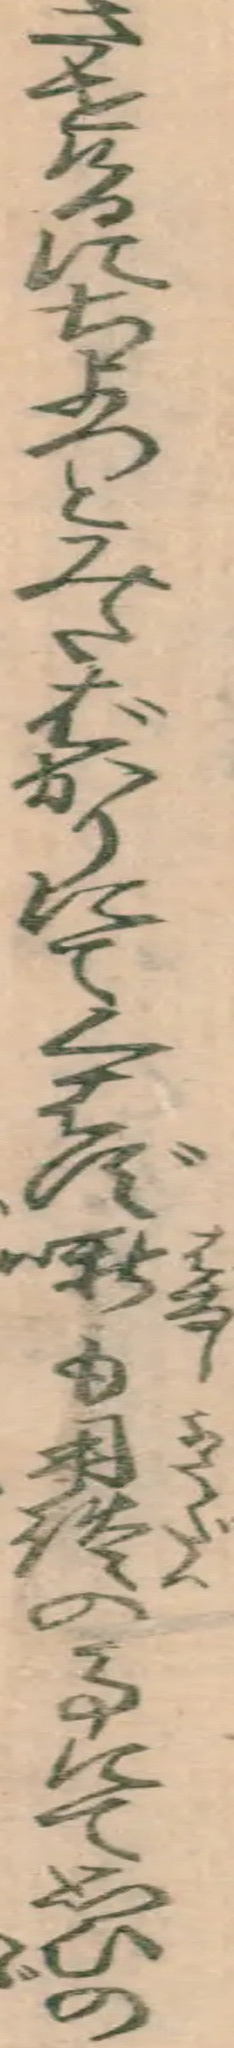させけるにちよつとみたばかりにてくはず噺も用談の事にて思ひの
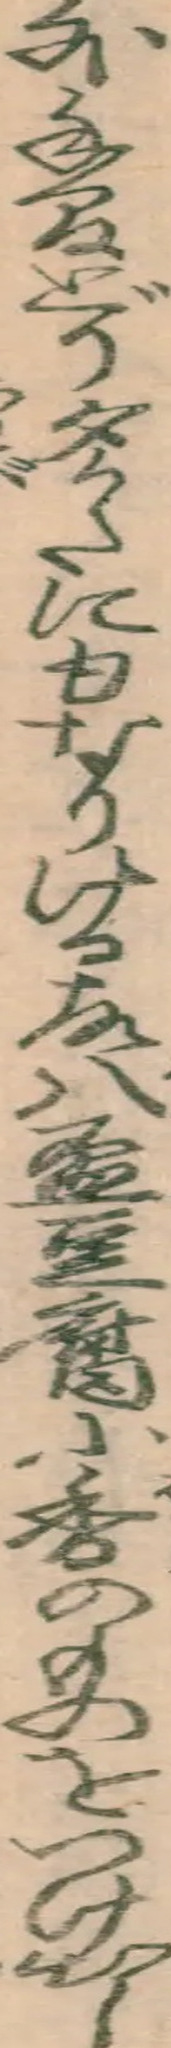外手間どり夕かたにもなりける故八盃豆腐に香のものをつけ出し
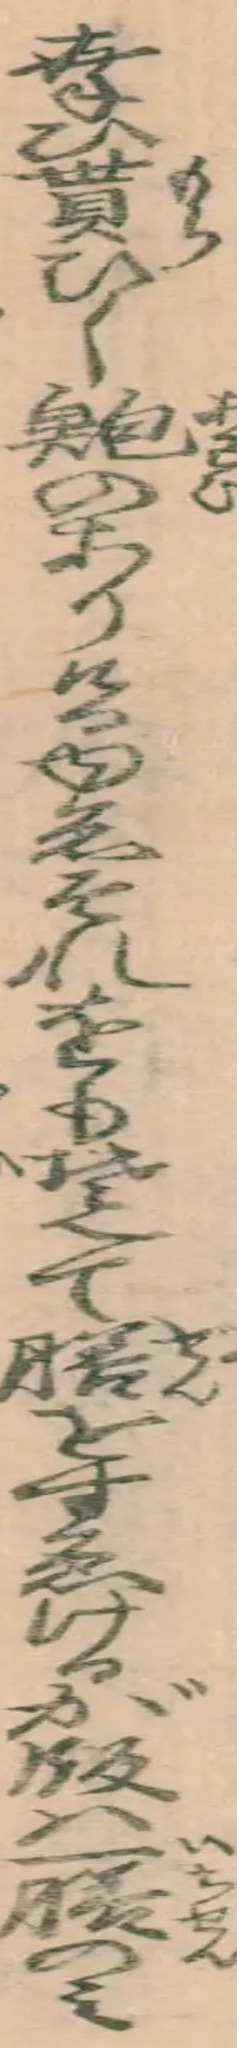幸ひ貰ひし鮑のありけるゆゑそれをもそへて膳をすゑけるが飯は一膳のみ
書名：日ごとの心得
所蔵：国立国会図書館 National Diet Library, JAPAN
